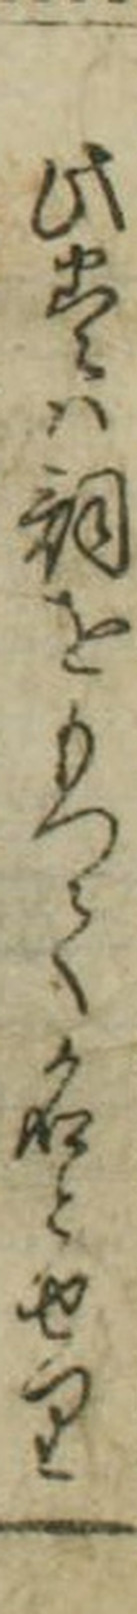此巻は詞をもつて名とせり
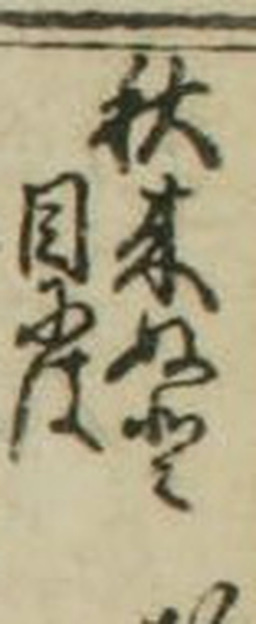目には
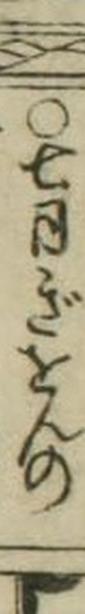○七日ぎをんの
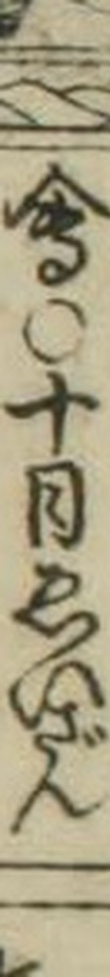会○十日ゑいざん
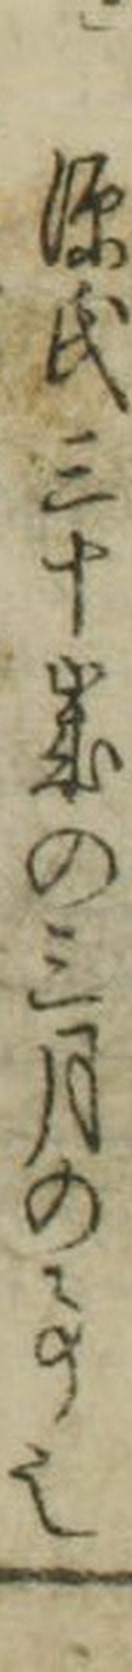源氏三十歳の三月の事也
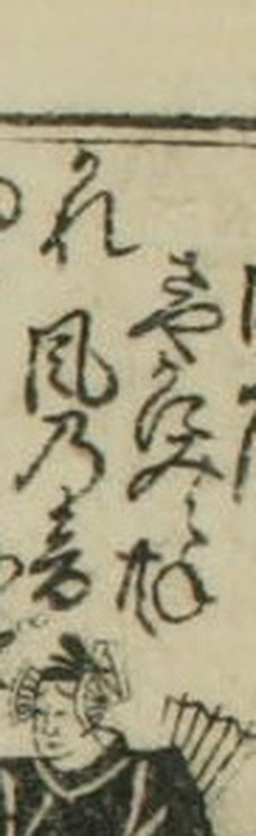かれ風の音
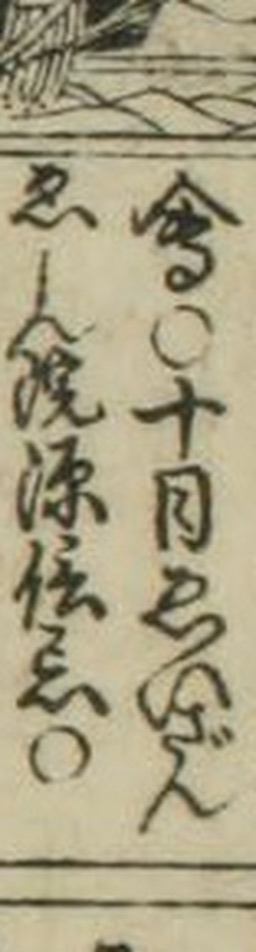ゑしん院源信忌○
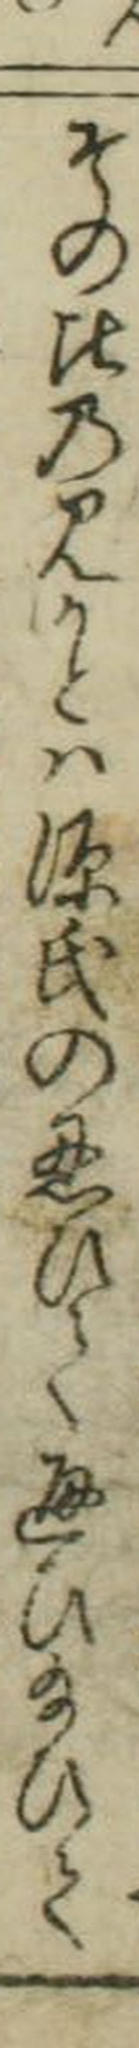その比のみかとは源氏の忍ひて通ひ給ひて
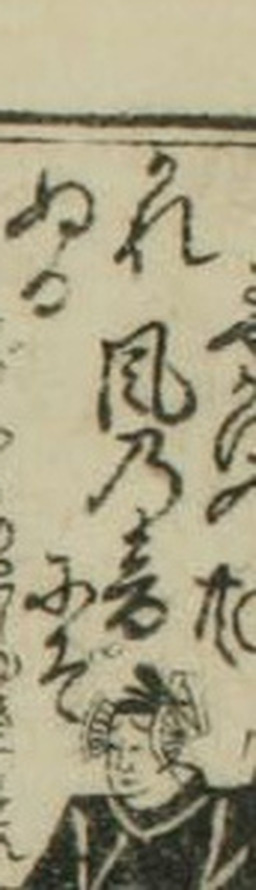ぬるにぞ
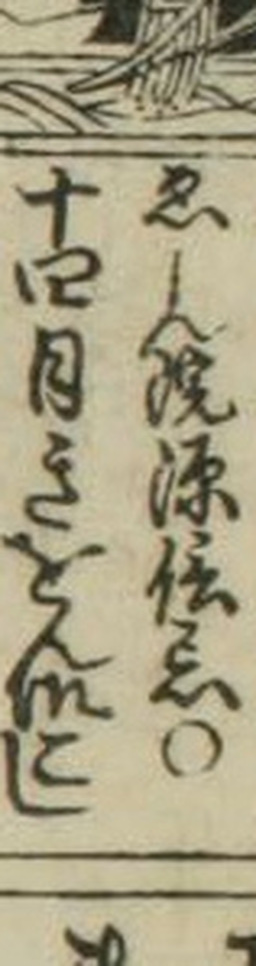十四日きをん御こし
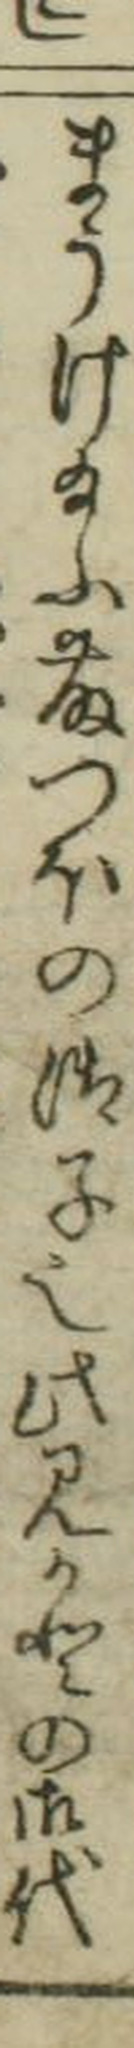まうけ給ふ藤つほの御子也みかとの御代
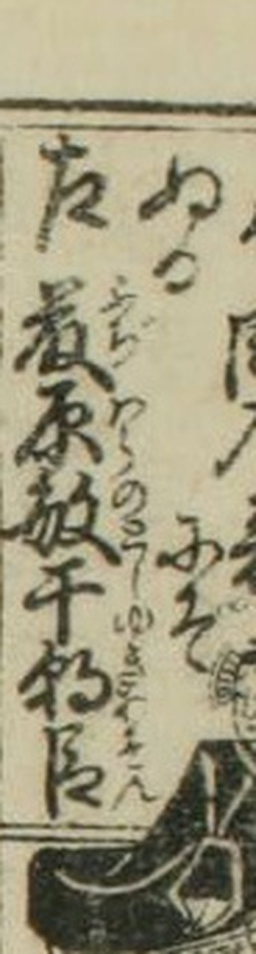左藤原敏于朝臣
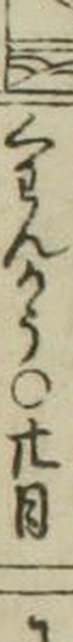くわんかう○廿日
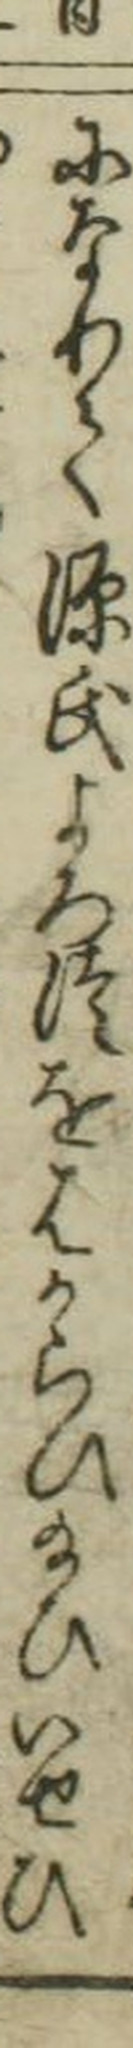になりて源氏よろつをはからひ給ひいせひ
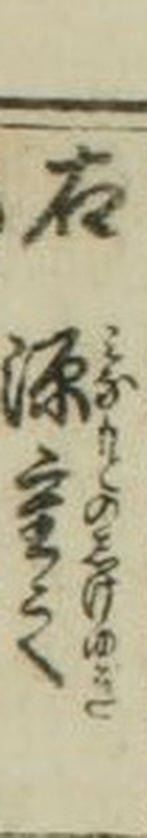右源重之
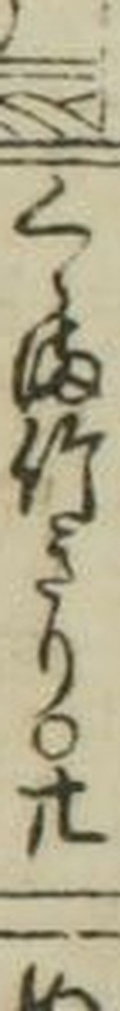くらま竹きり○廿
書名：女源氏教訓鑑
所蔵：東京学芸大学附属図書館
